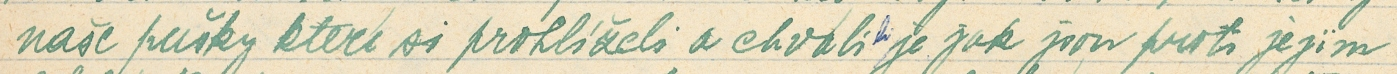naše pušky které si prohlíželi a chválili je jak jsou proti jejim
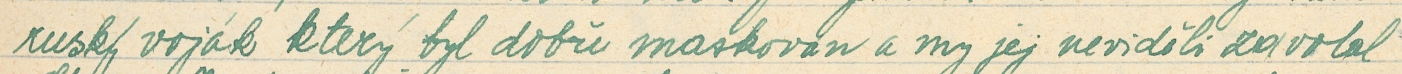ruský voják který byl dobře maskovan a my jej neviděli zavolal
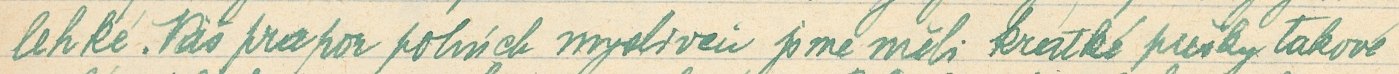lehké. Náš prapor polních myslivců jsme měli krátké pušky takové
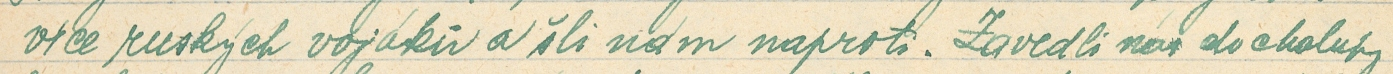více ruských vojáků a šli nám naproti. Zavedli nás do chalupy
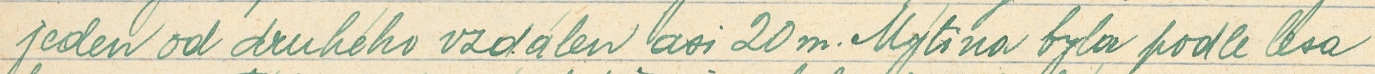jeden od druhého vzdálen asi 20 m. Mýtina byla podle lesa
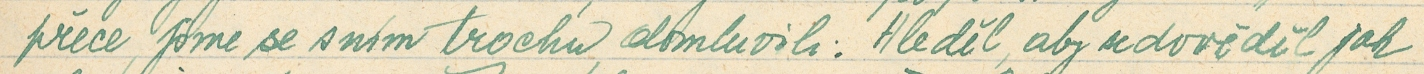přece jsme se s ním trochu domluvili. Hleděl, aby se dověděl jak
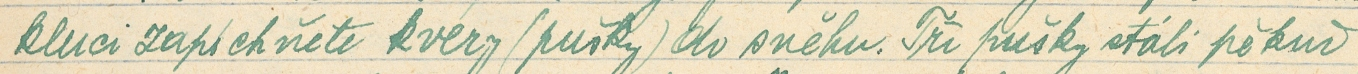kluci zapíchněte kvéry (pušky) do sněhu. Tři pušky stáli pěkně
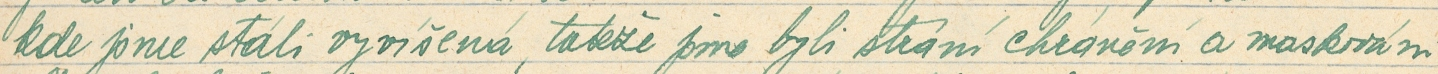kde jsme stáli vyvíšená, takže jsme byli strání chránění a maskování
